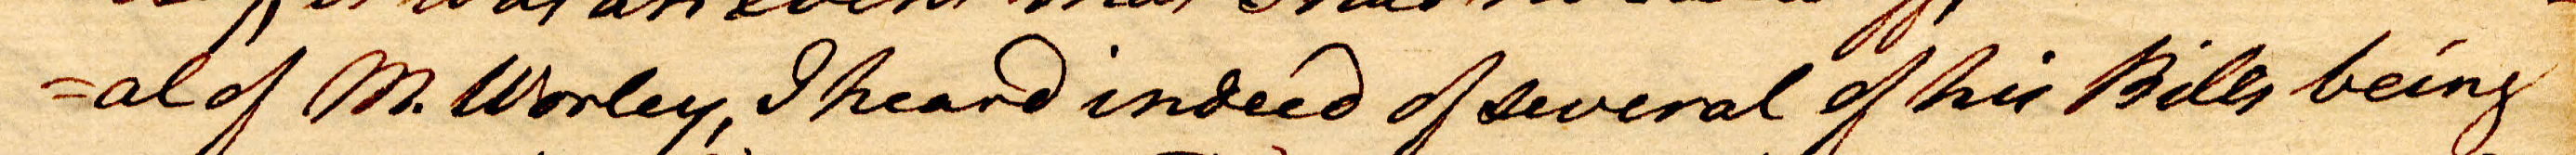-al of M. Worley, I heard indeed of several of his Bills being
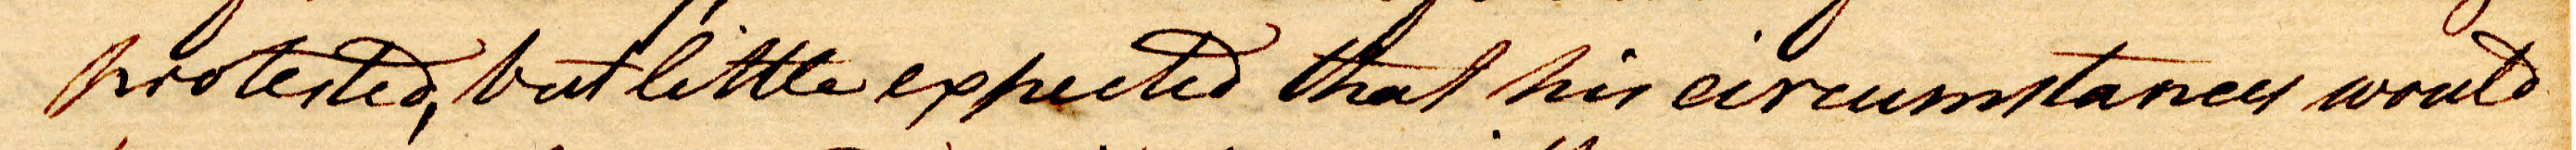protected, but little expected that his circumstances would
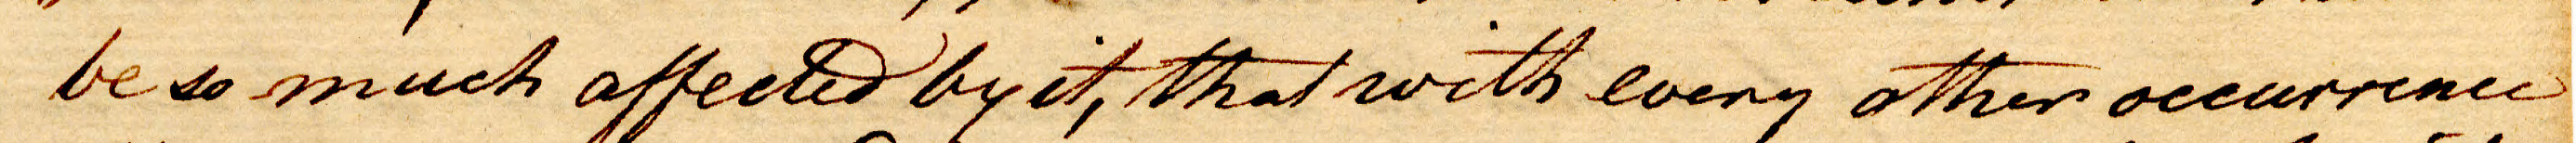be so much affected by it, that with every other occurrence
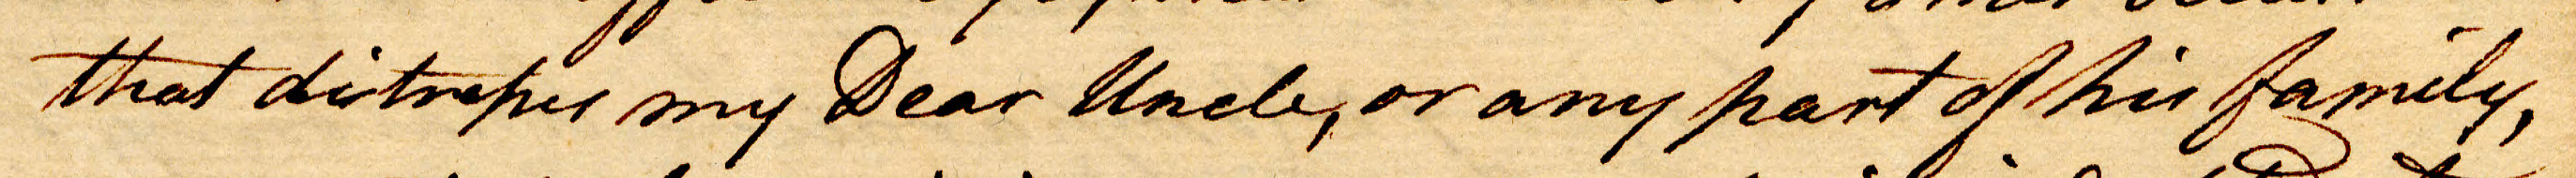that distresses my Dear Uncle, or any part of his family,
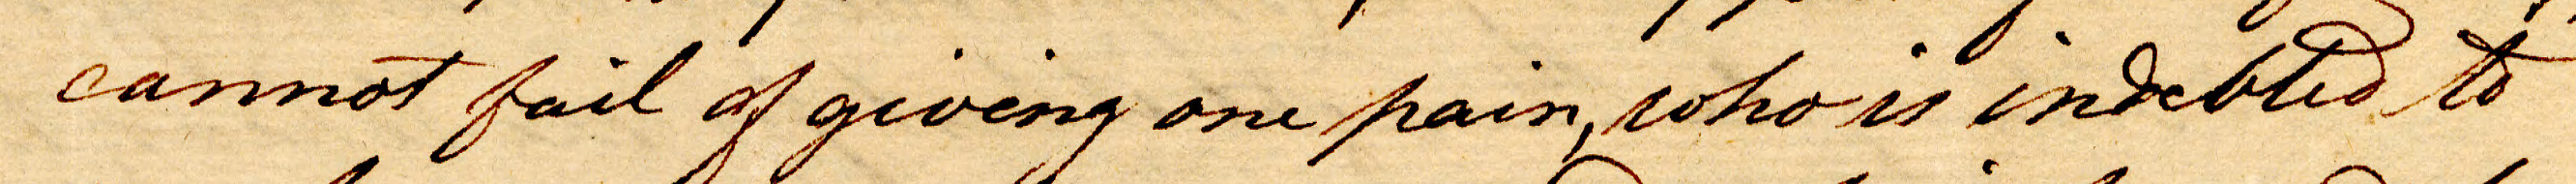cannot fail of giving one pain, who is indebted to
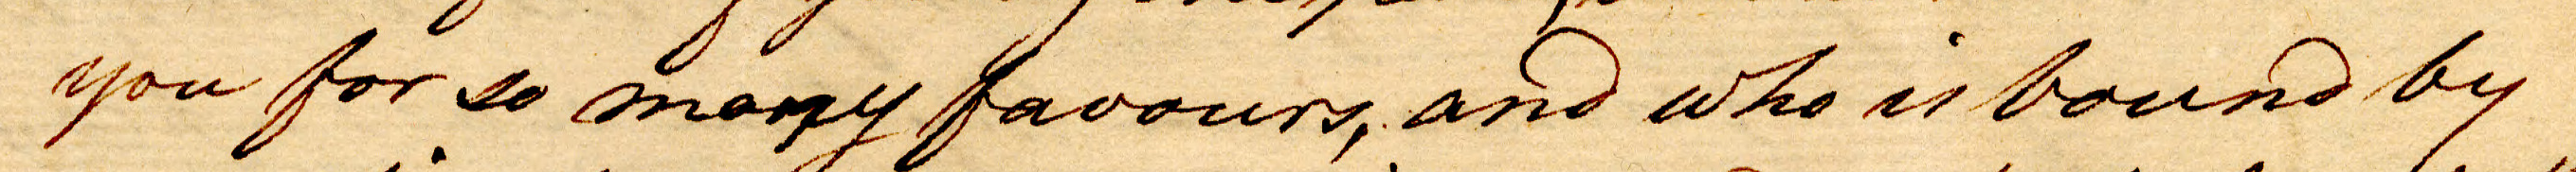you for so many favours, and who is bound by
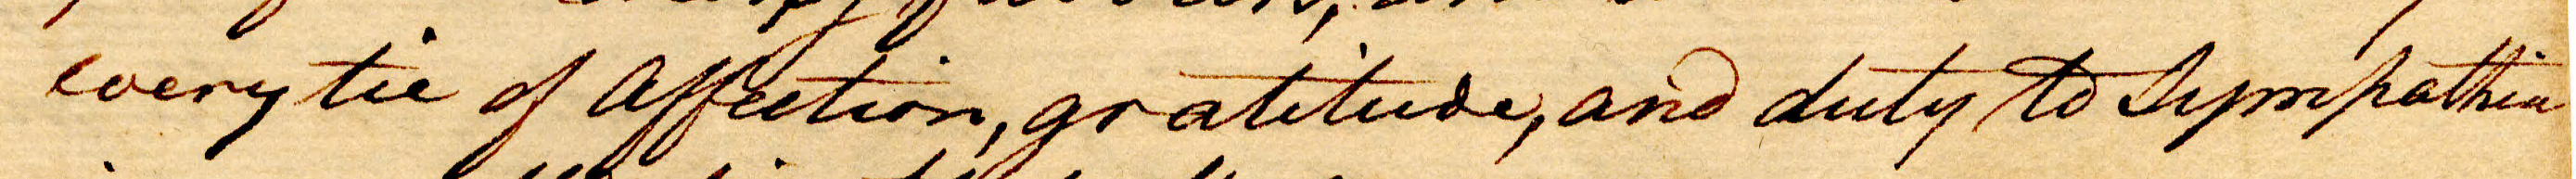every tie of Affection, gratitude, and duty to sympathize
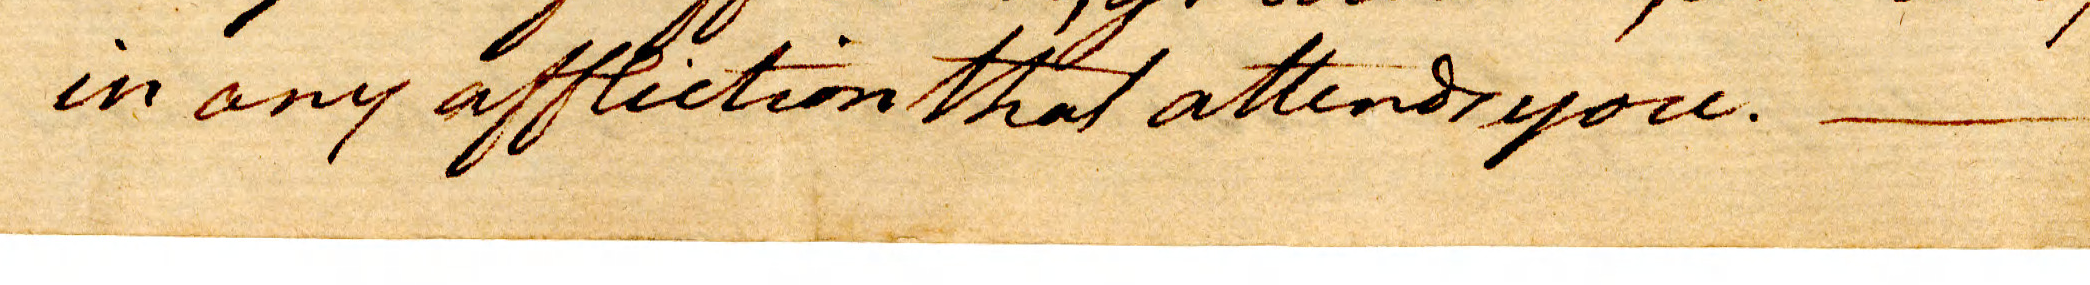in any affliction that attends you.-
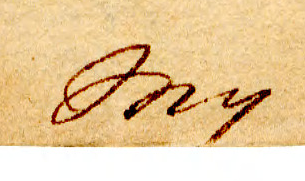My
